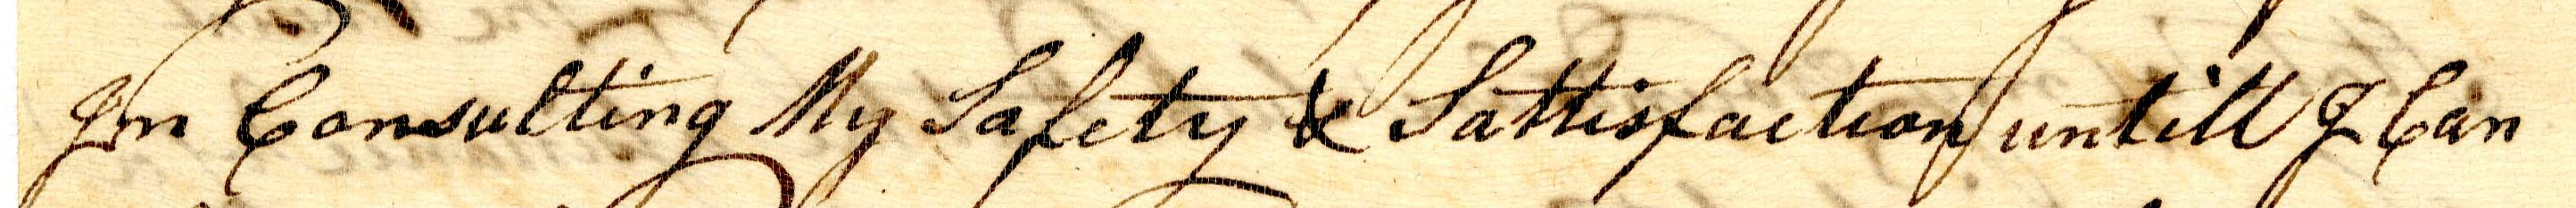In Consulting My Safety & Sattisfaction untill I Can
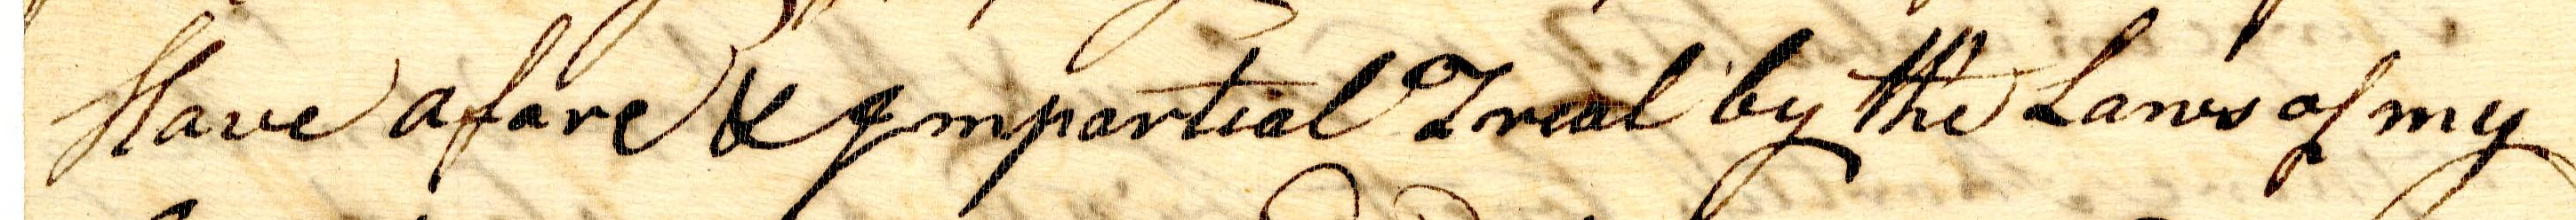Have afare & impartial Trial by the Laws of my
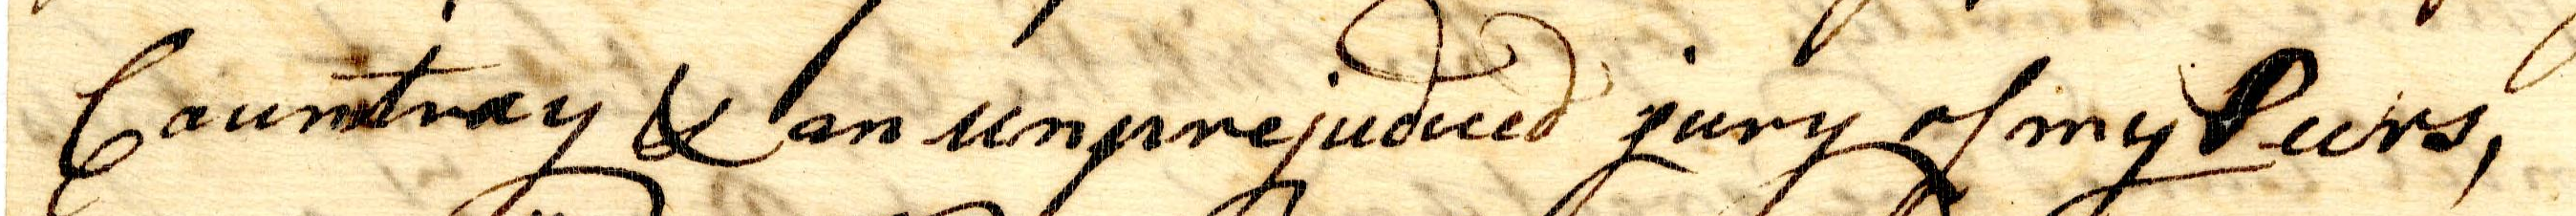Countray & an unprejudiced jury of my Peers,
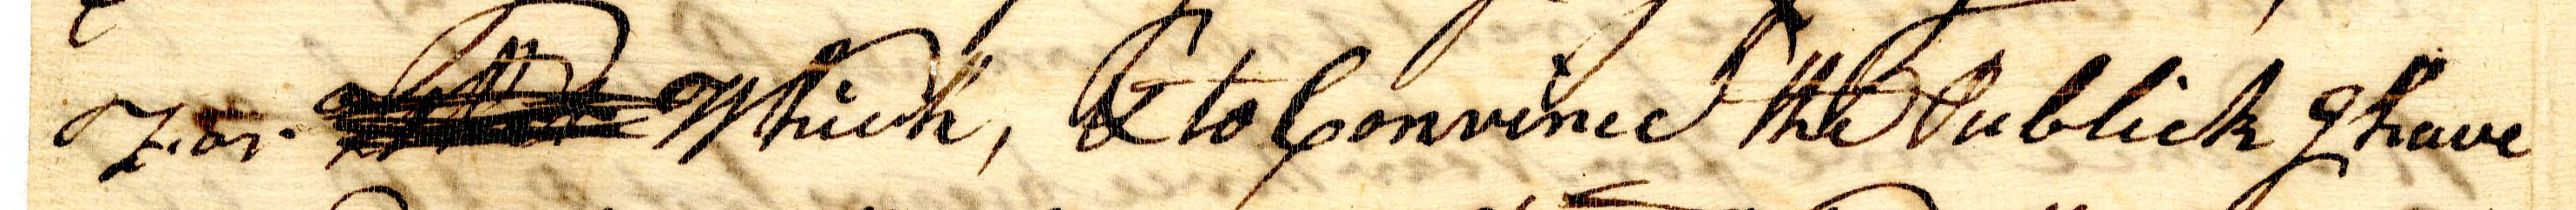For [_____] Which, & to Convince the Publick I have
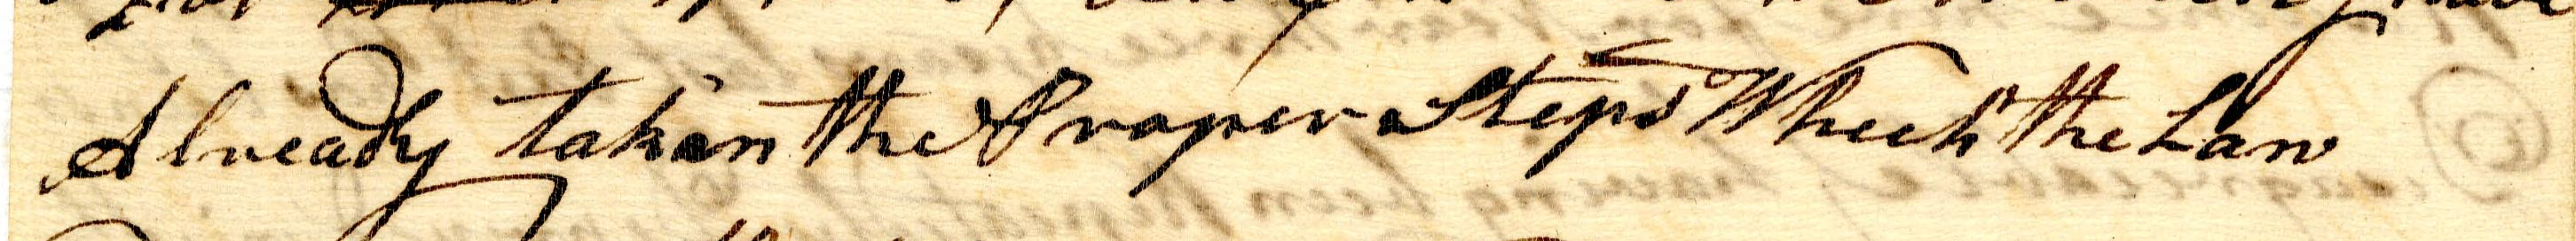Already taken the Proper Steps Which the Law
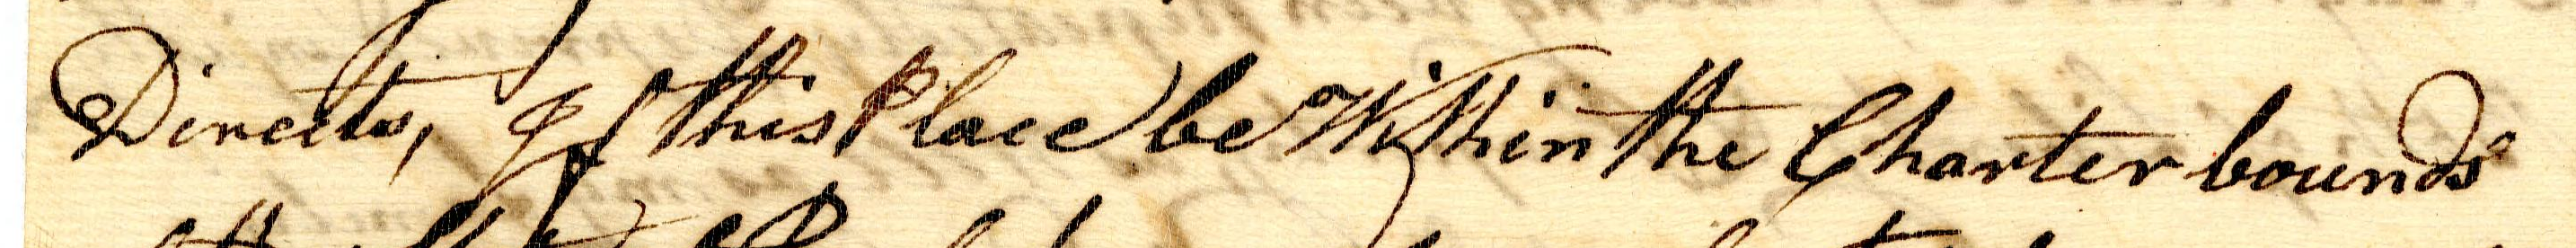Directs, If this Place be Wither the Charter bounds
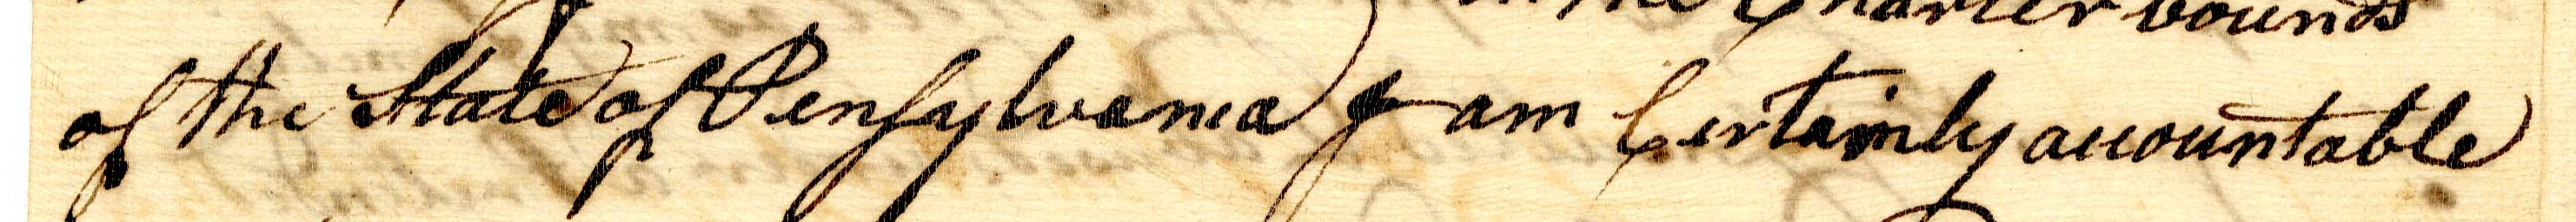of the State of Pensylvania I am Certainly accountable
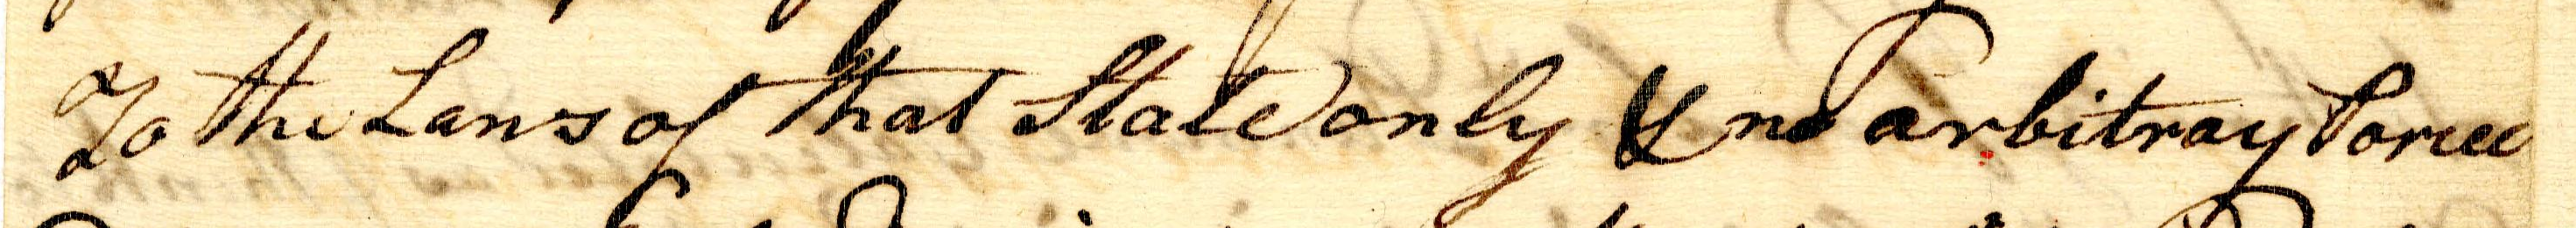To the Laws of that State only & no arbitray Porce
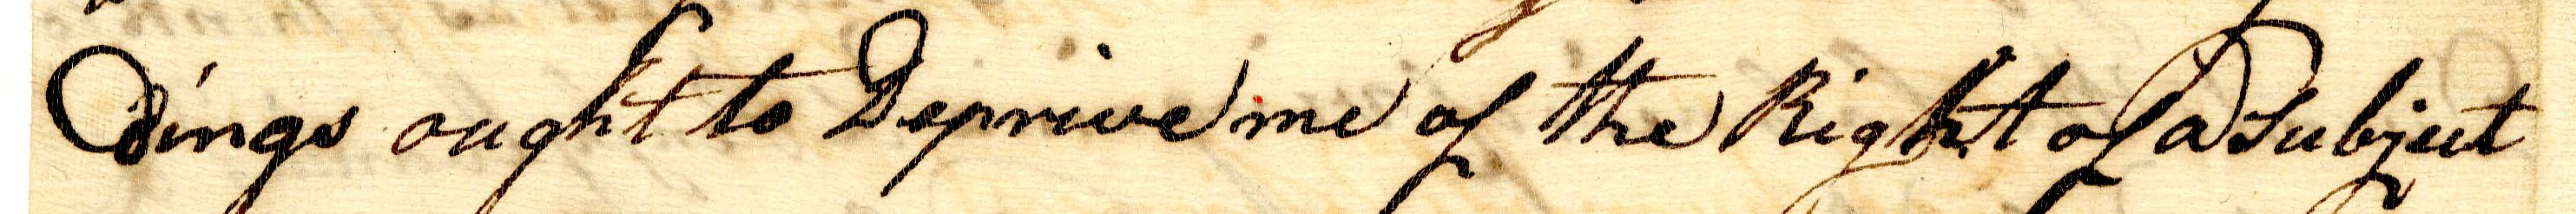dings ought to Deprive me of the Right of a subject
